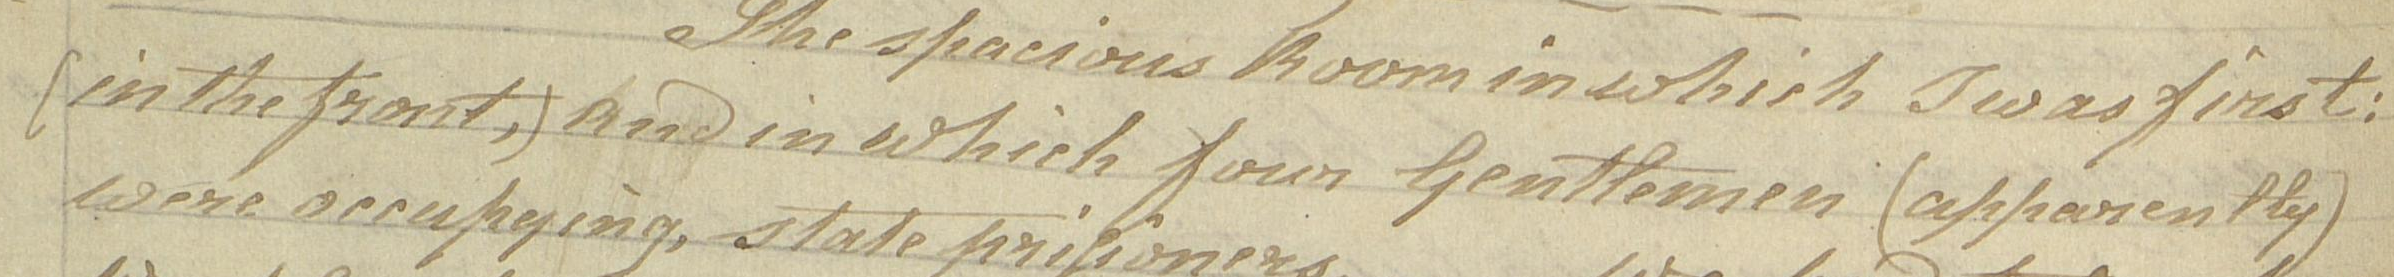(in the front,) and in which four Gentlemen (apparently)
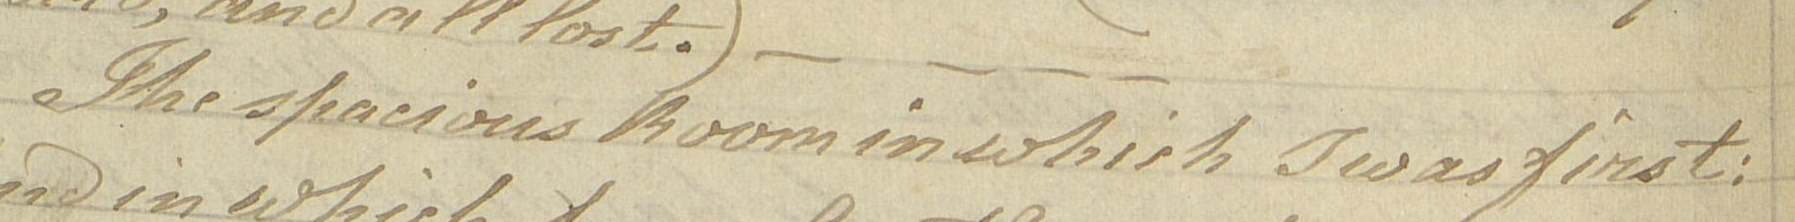The spacious Room in which I was first
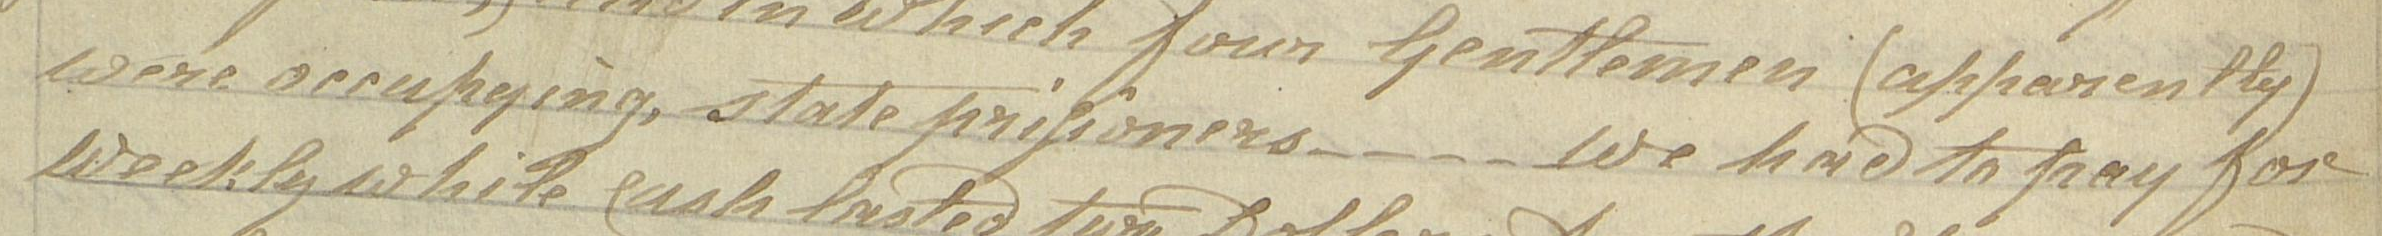were occupying, state prissoners We had to pay for
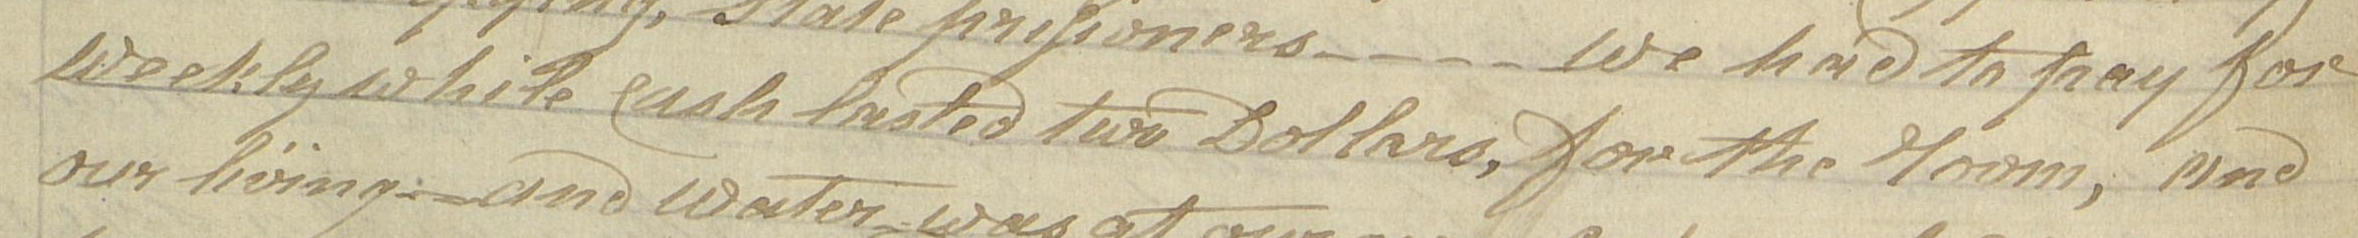Weekly while cash lasted two Dollars, for the Room, and
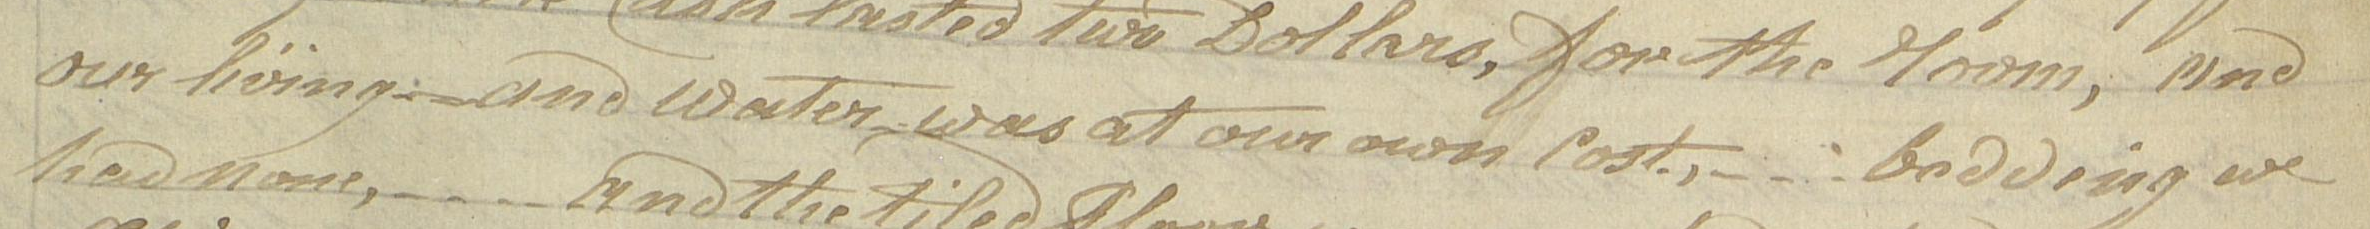our living and Water, was at our own cost, bedding we
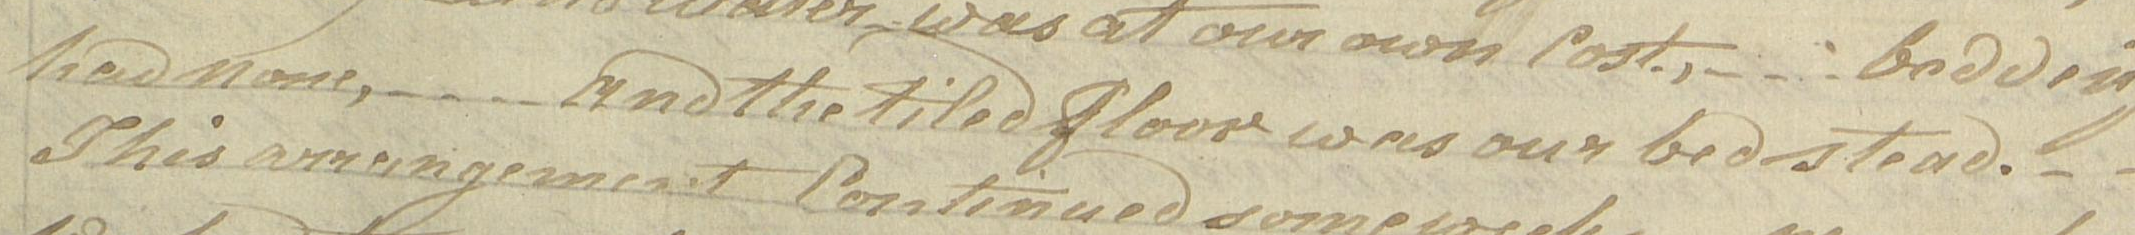had none, And the tiled floor was our bed stead.
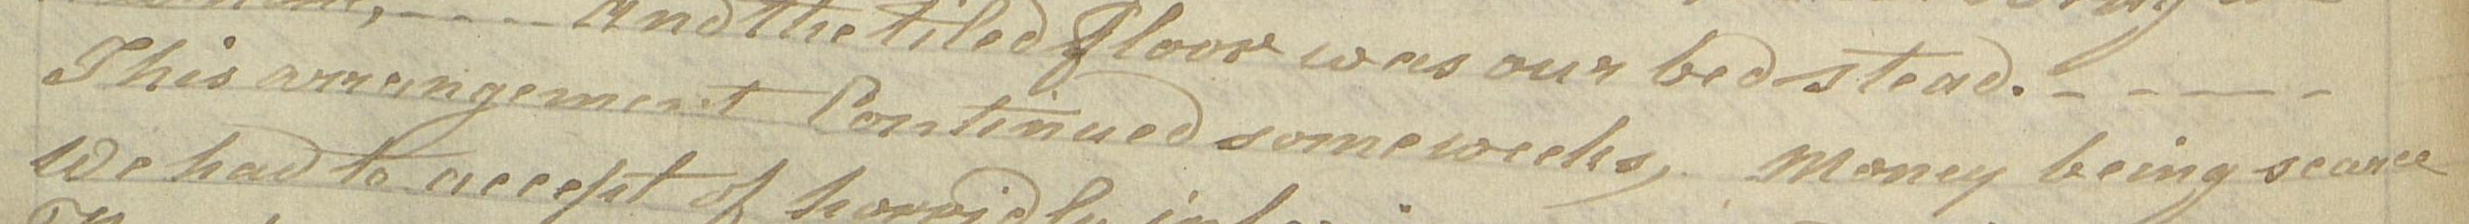This arrangement Continued some weeks, Money being scarce
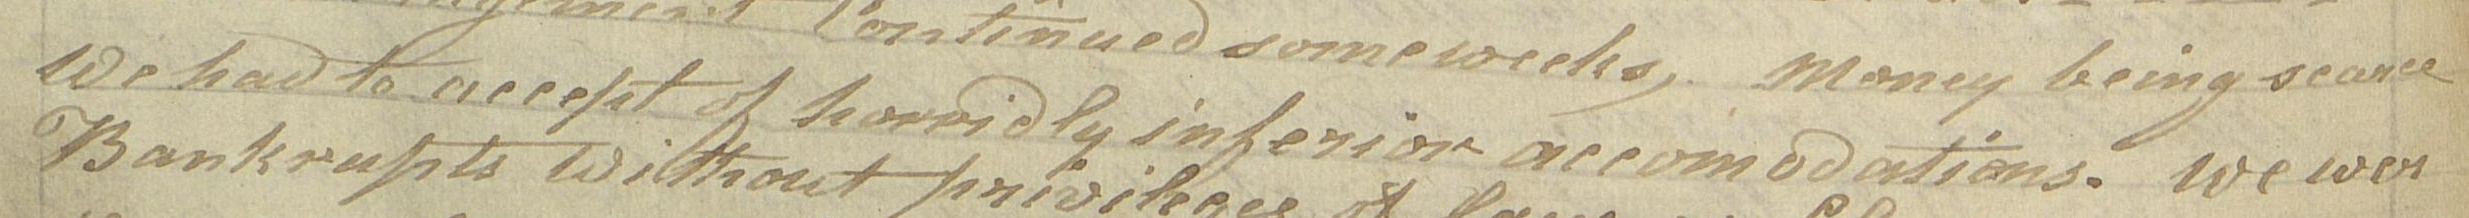We had to accept of horridly inferior accomodations. we wer
